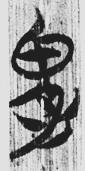{胃刀}（謂）
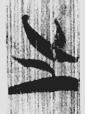之
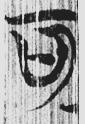可（何）
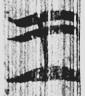王
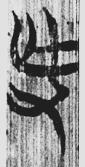拃（作）
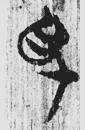色
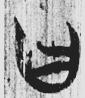曰
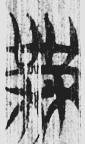無
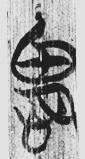愄（畏）
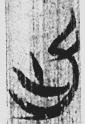此
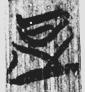是
